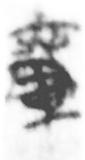𨍱（乘）
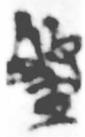○（畋）
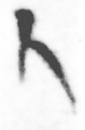人
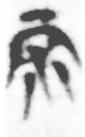兩
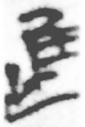○（踓）
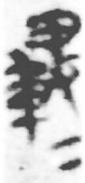○（卑）
